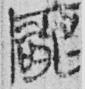○（厲）
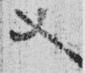又（有）
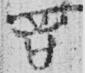言
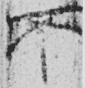不
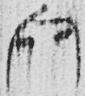夂（終）
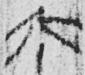六
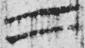二
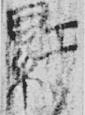○（鴻）
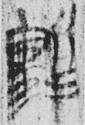漸
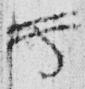于
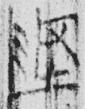{阪土}（阪）
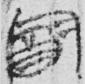酓（飲）
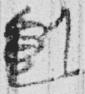飤（食）
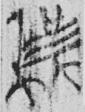衎衎
